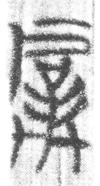厚奉
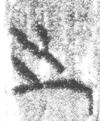之
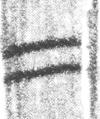二
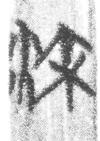浍（沬）
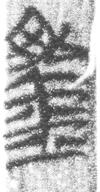○（盤）
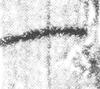一
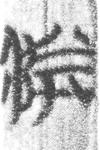○（浣）
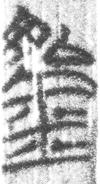○（盤）
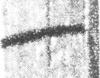一
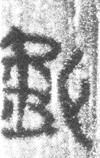鉈（匜）
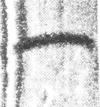一
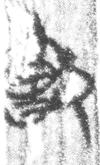○（合）
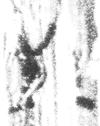○（瓶）
